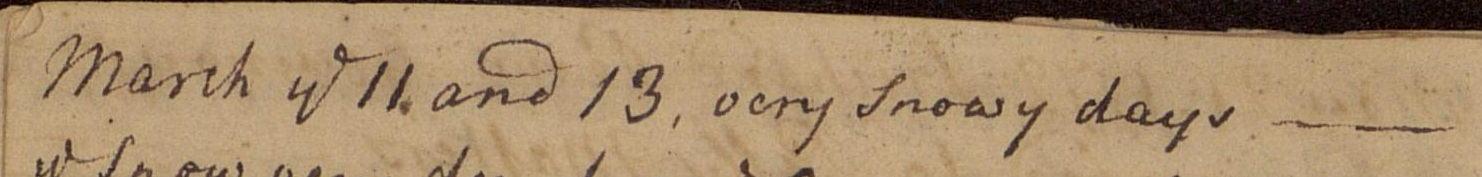March y^e 11 and 13, very Snowy days -
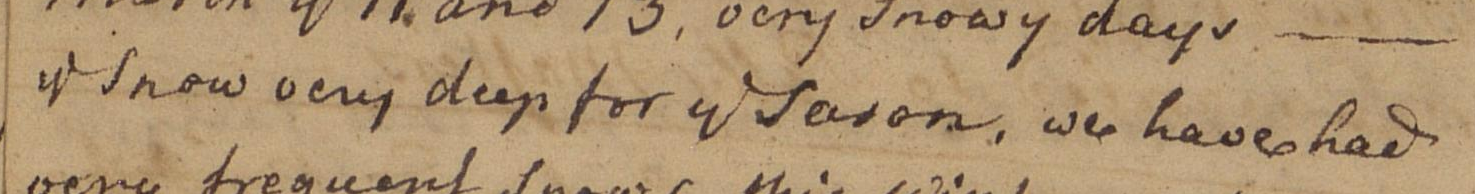y^e snow very deep for y^e Season, we have had
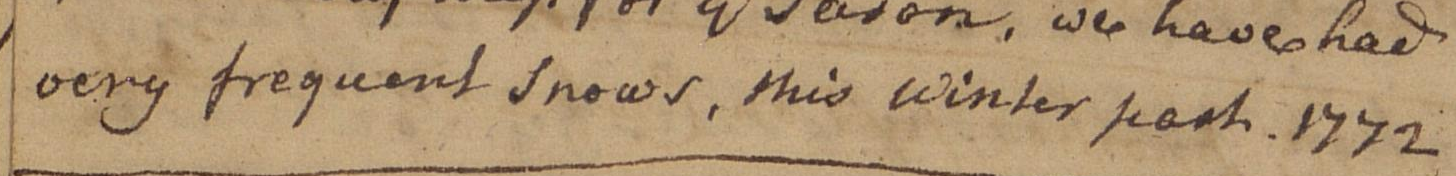very frequent Snows, this winter past. 1772
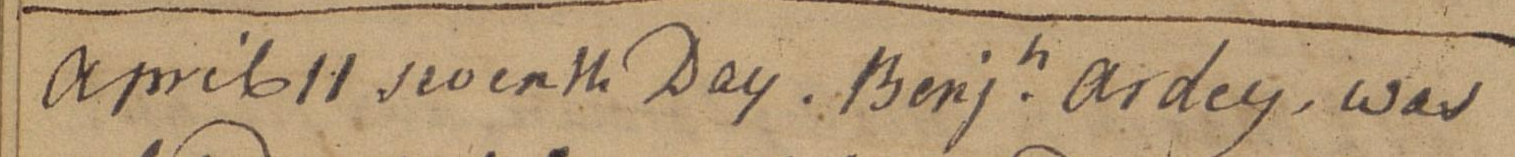April 11 seventh Day. Benj^n. Ardey, was
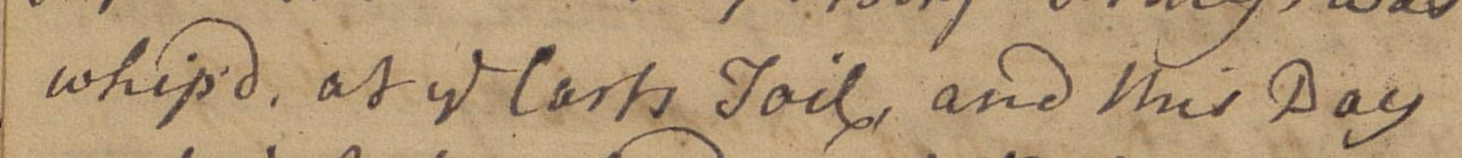whip'd, at y^e Carts Tail, and this Day
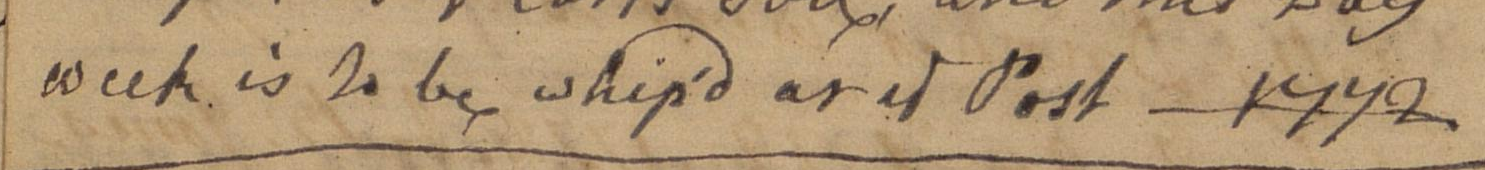week is to be whip'd at y^e Post- 1772
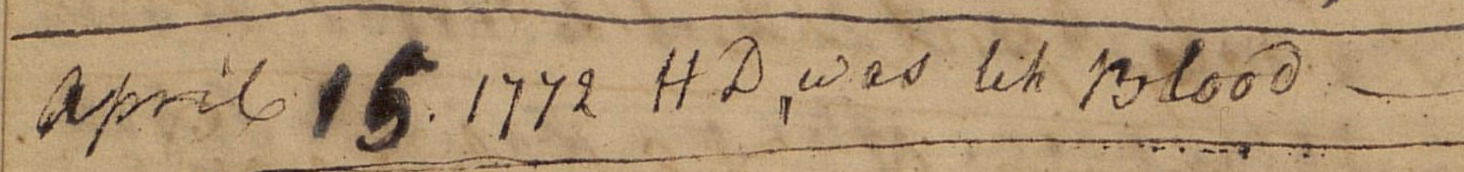April 15 1772 HD wis let Blood-
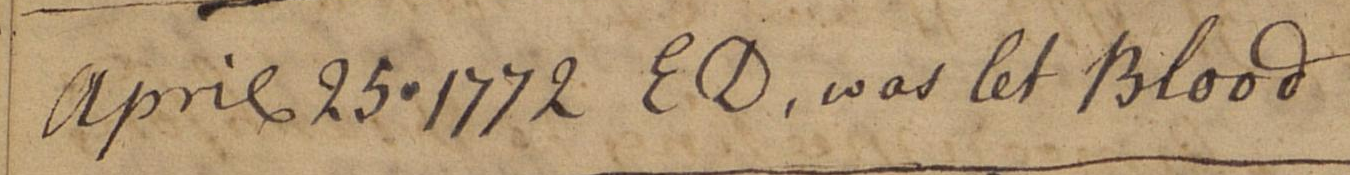April 25. 1772 ED, was let Blood
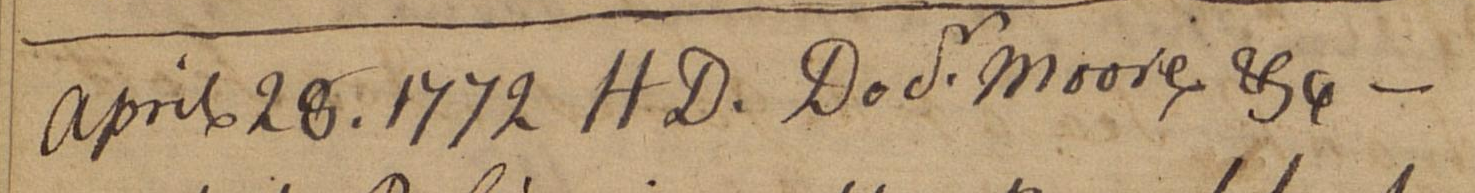April 28. 1772 HD. Doc^r. Moore &c-
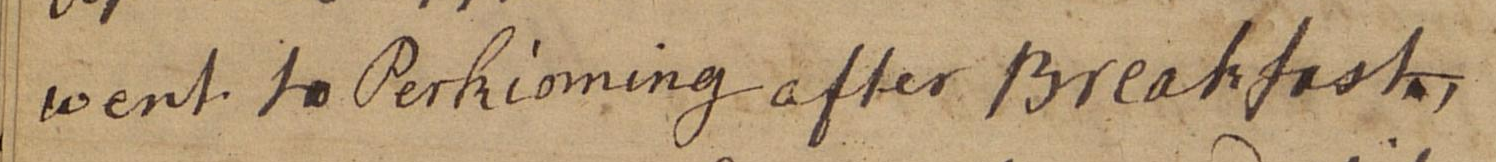went to Perkioming after Breakfast,
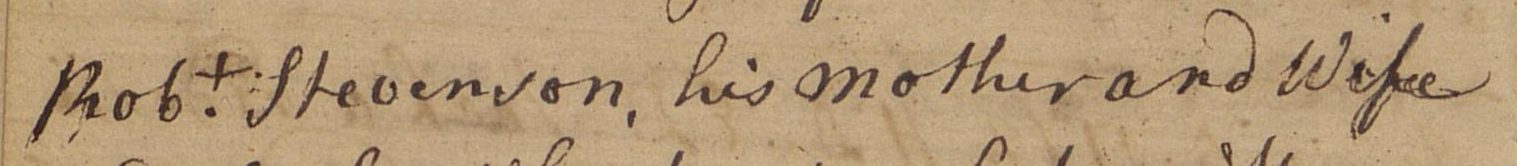Rob^t. Stevenson, his mother and Wife
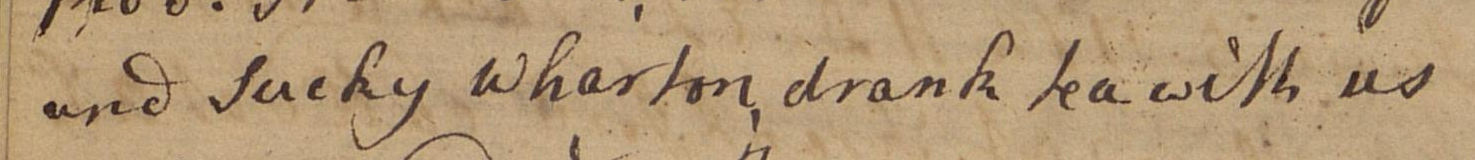and Sucky Wharton, drank tea with us
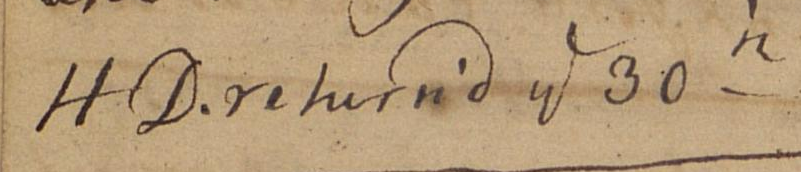HD. return'd y^e 30-
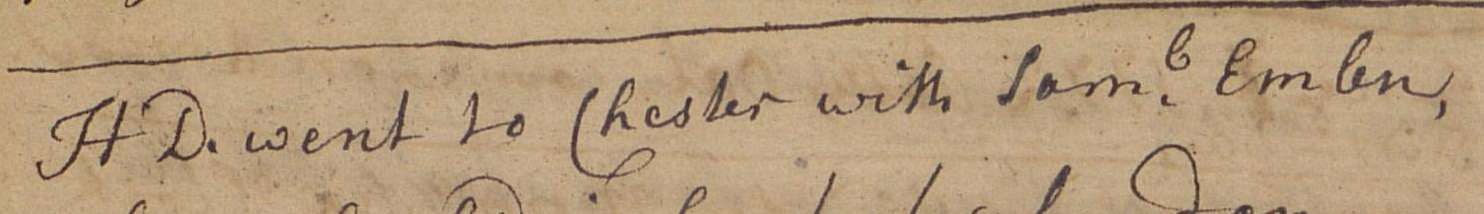HD. went to Chester withSam^l Emlen,
